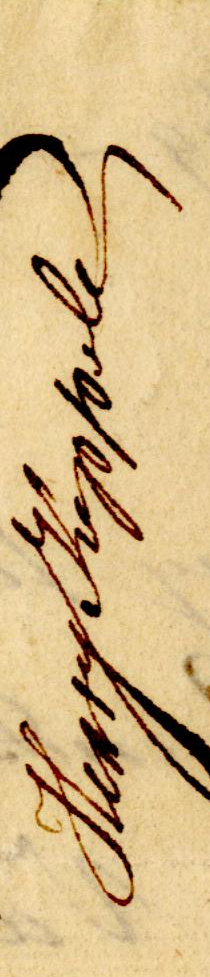Henry Keppele
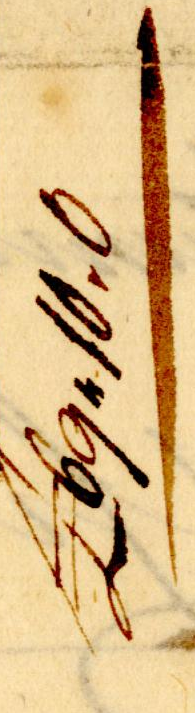£69..10..0
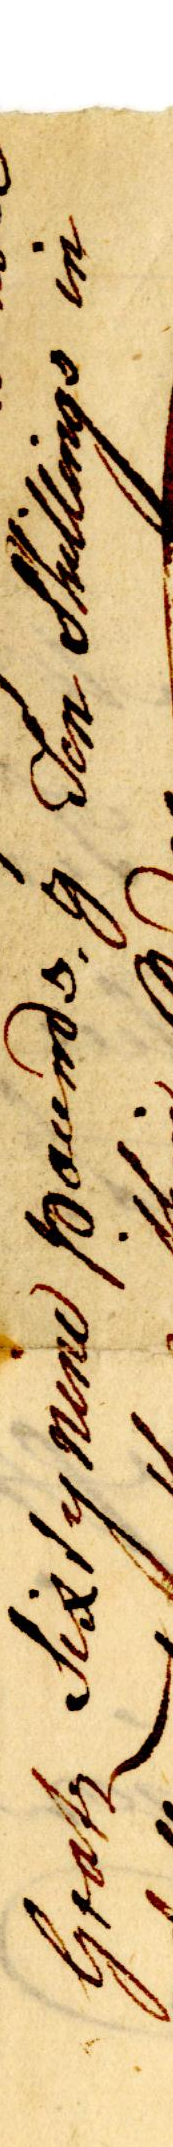Gratz sixty Nine Pounds & ten shillings in
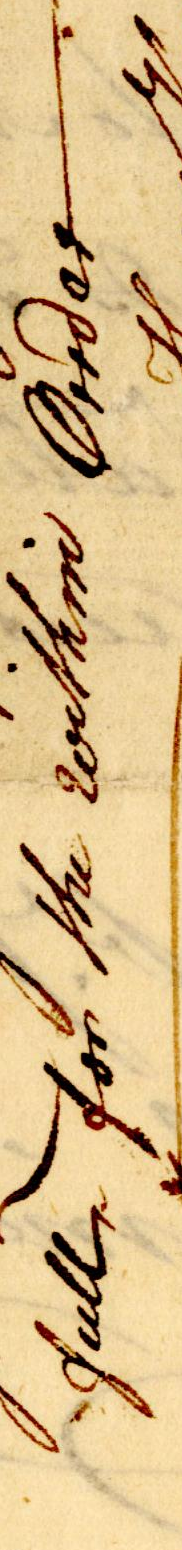full for thee within Order
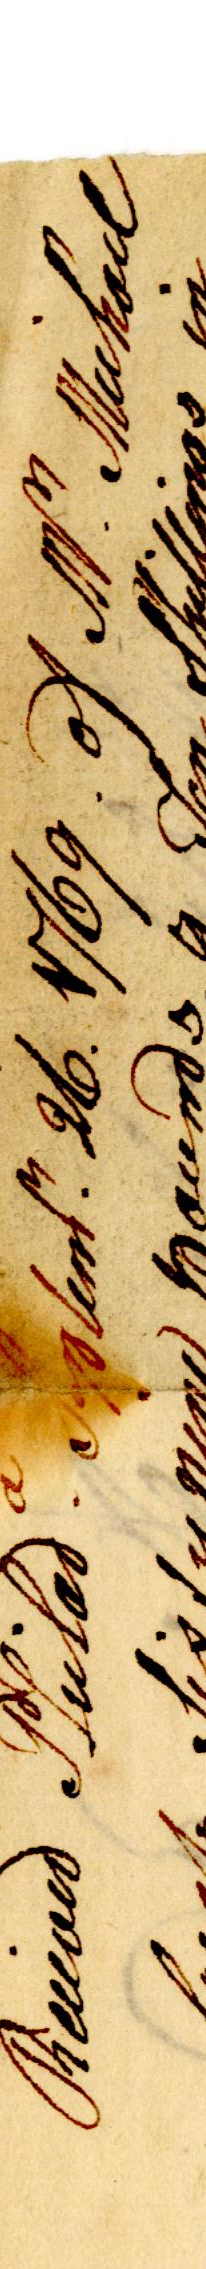Recieved Philad^a. Septem^r. 26^th. 1769. of M^r. Michael
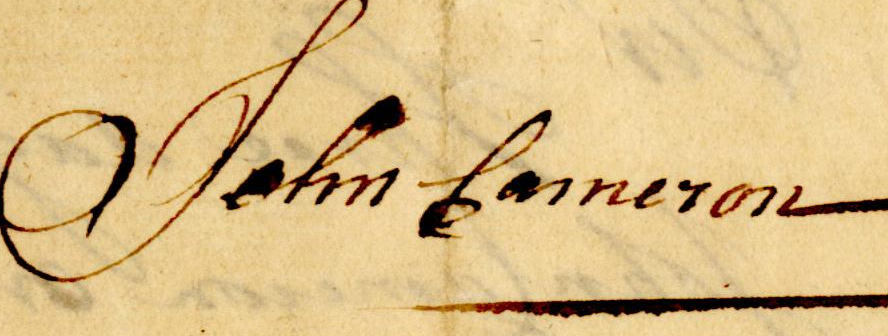John Cameron
